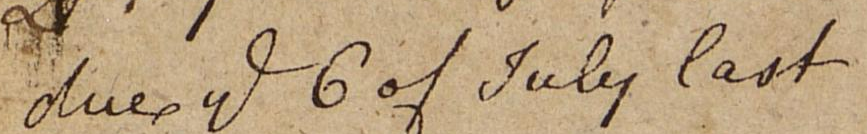due y^e 6 of July last
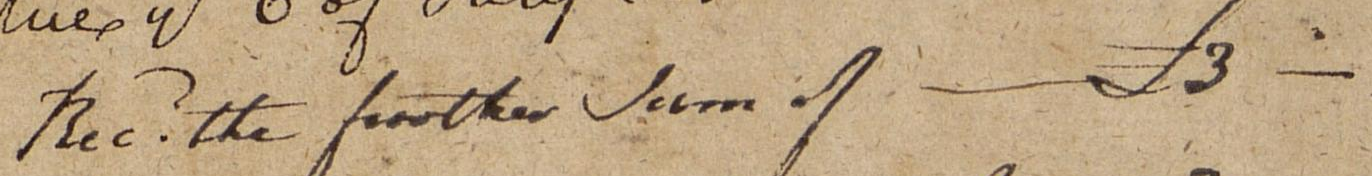Rec^d. the further Sum of - 3 Shillings -
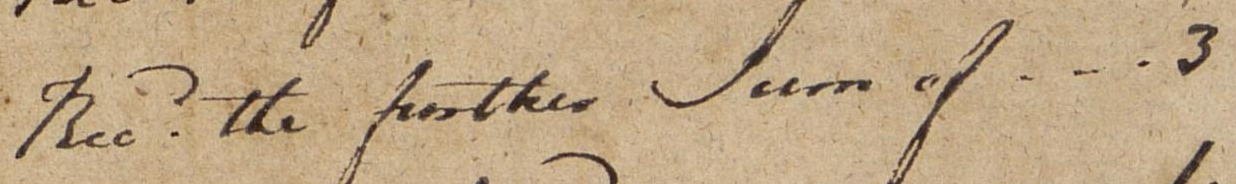Rec^d. the further Sum of . . . 3
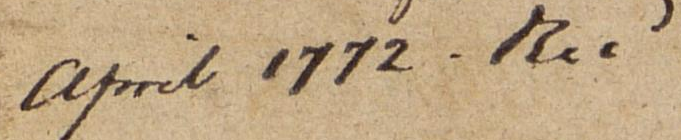April 1772 . Rec^d
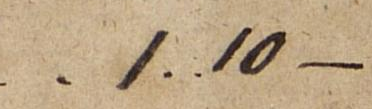1 . . 10 -
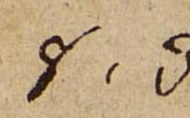8 . 3
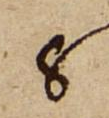8
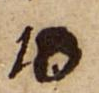10
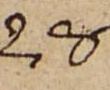28
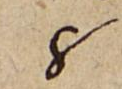8
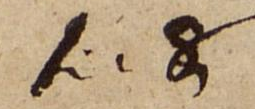1 . 8
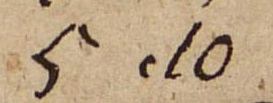5 .10
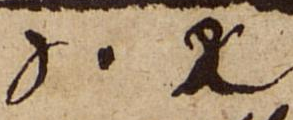8 . 2
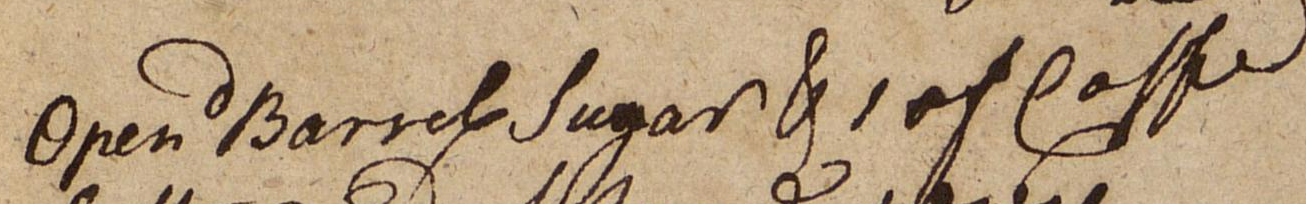Open^d Barrel Sugar & 1 of Coffe
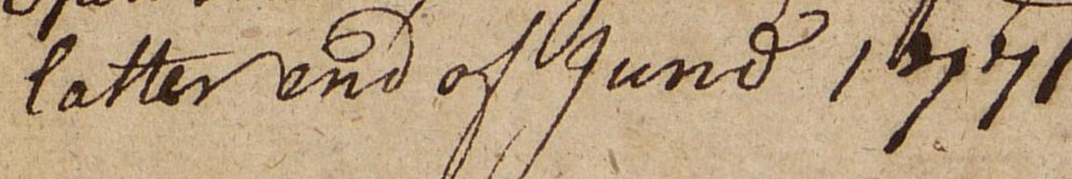latter end of June 1771
